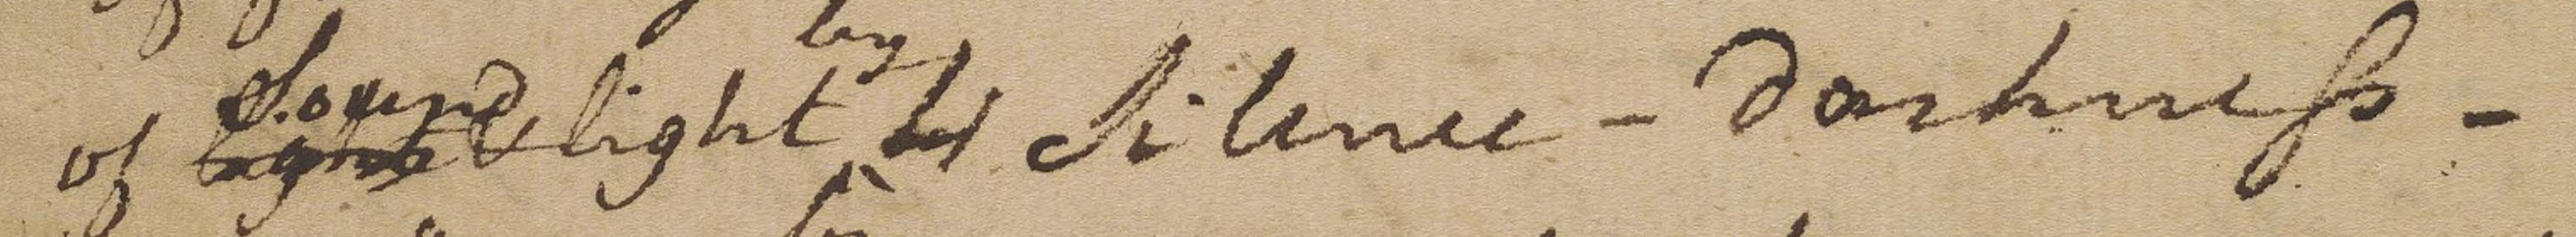of [light] & light ^by 4 Silence- darkness-
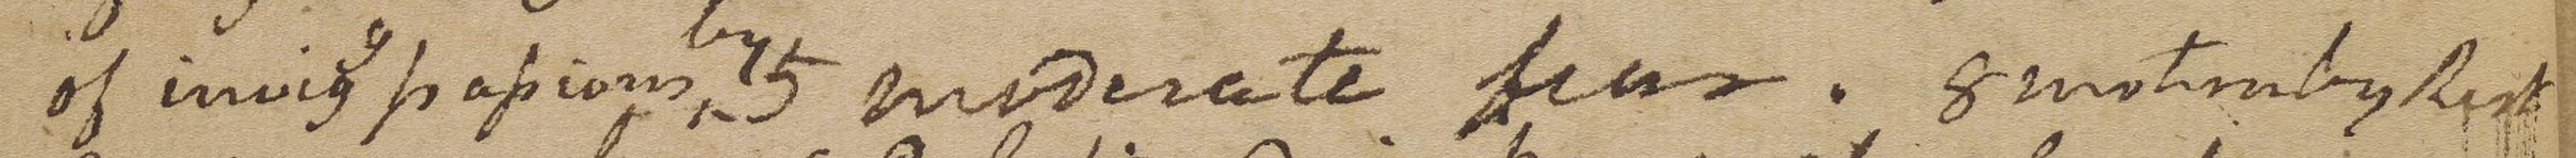of invig^g passions ^by 5 moderate fear. 8 moterly Rest
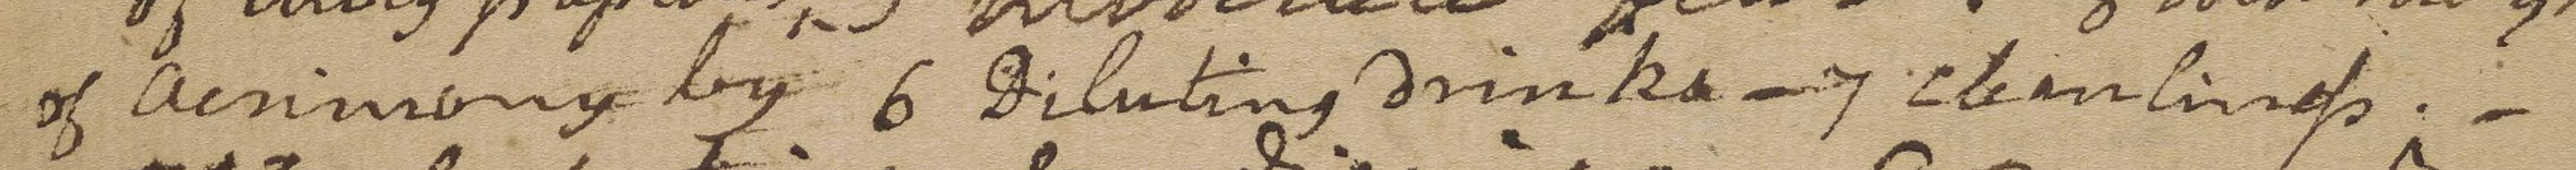of Acrimony by 6 Diluting drinks- 7 cleanliness.-
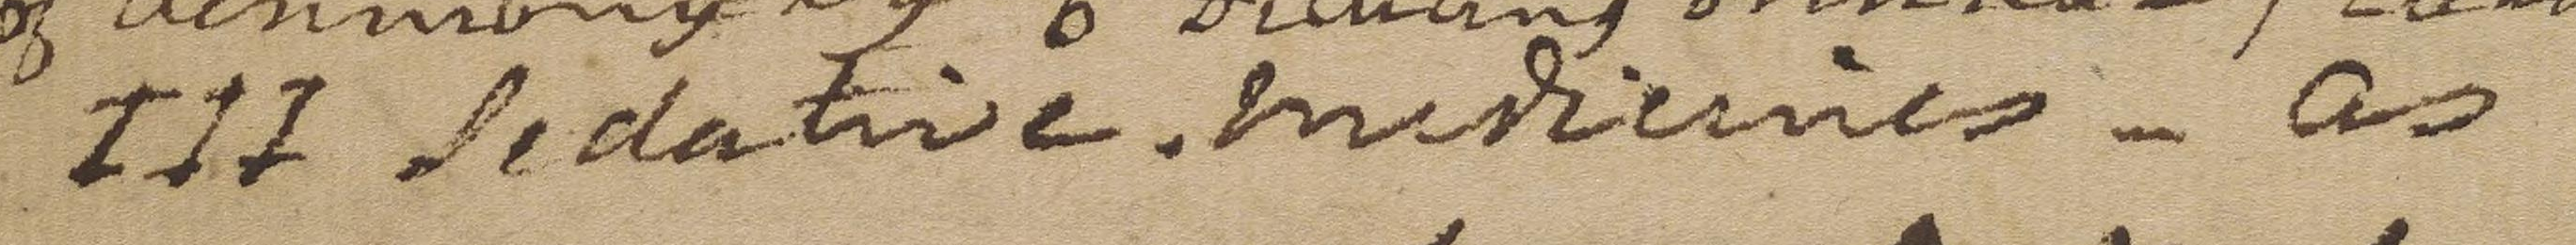III Sedative mercuries- as
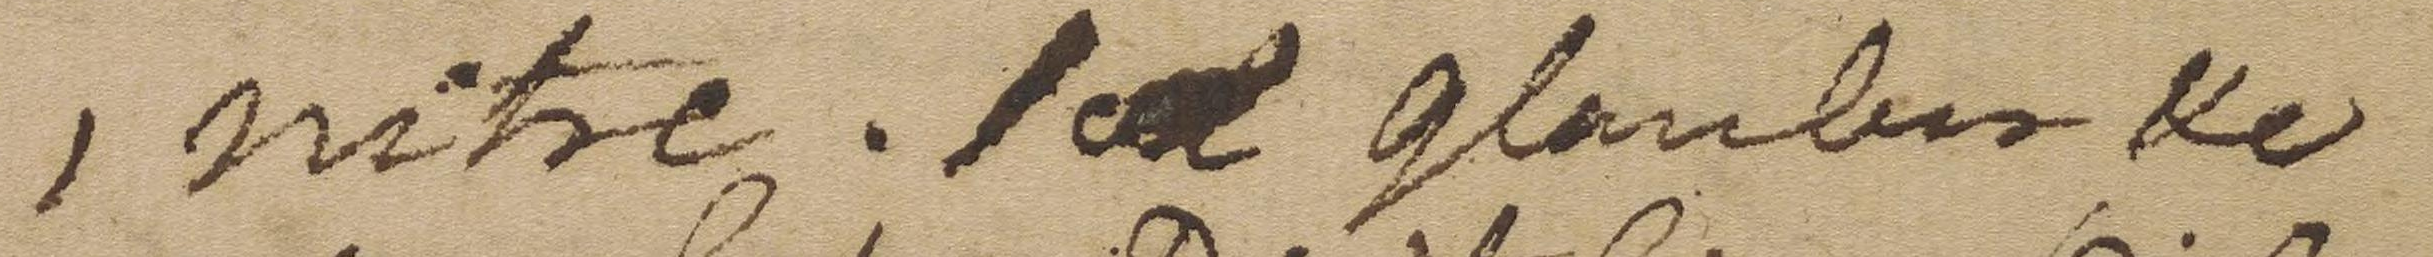1 nitre. [___] glaubus &c
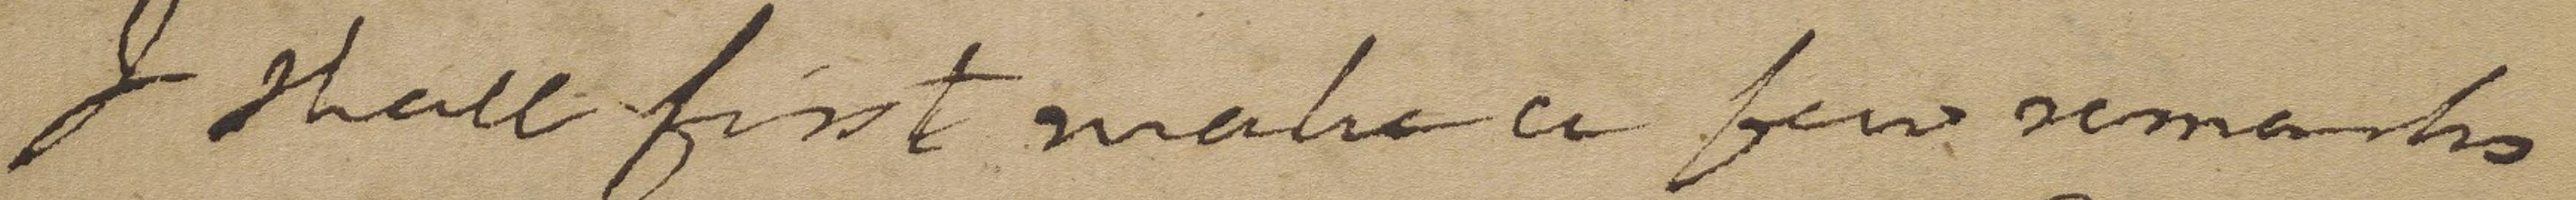I shall first make a few marks
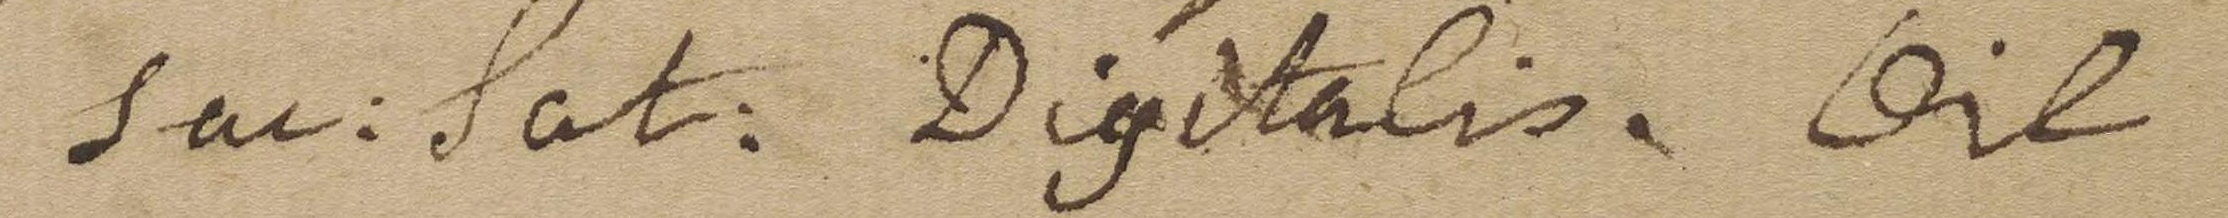Sai: Sat: Digitalis. Oil
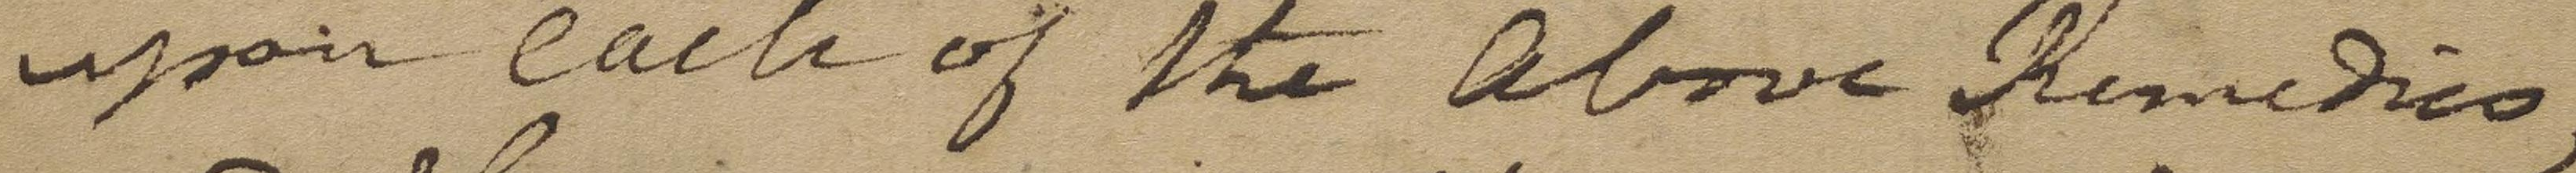upon each of the above Remedies
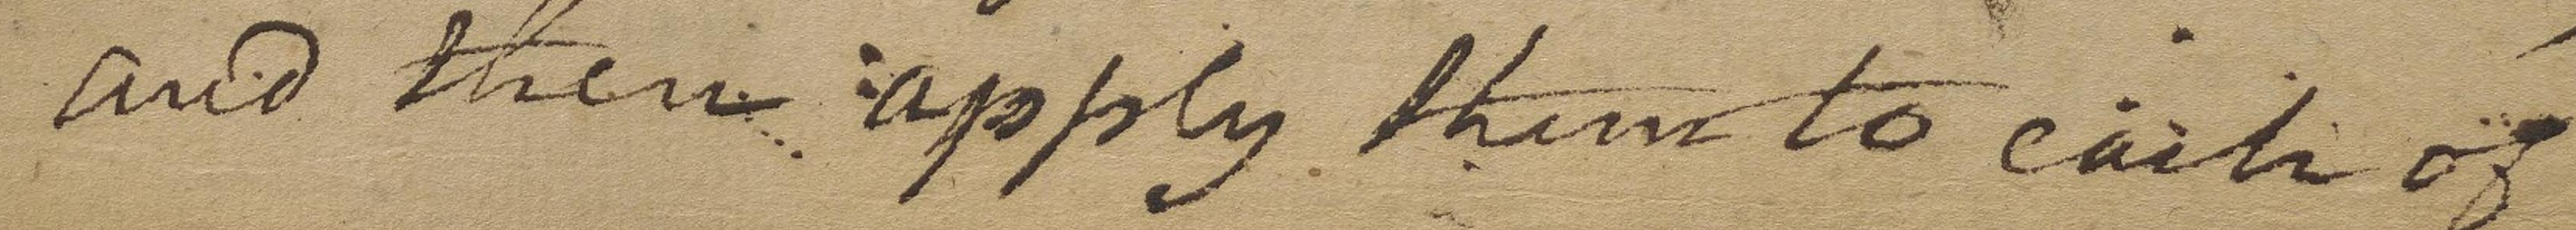and then apply them to each of
